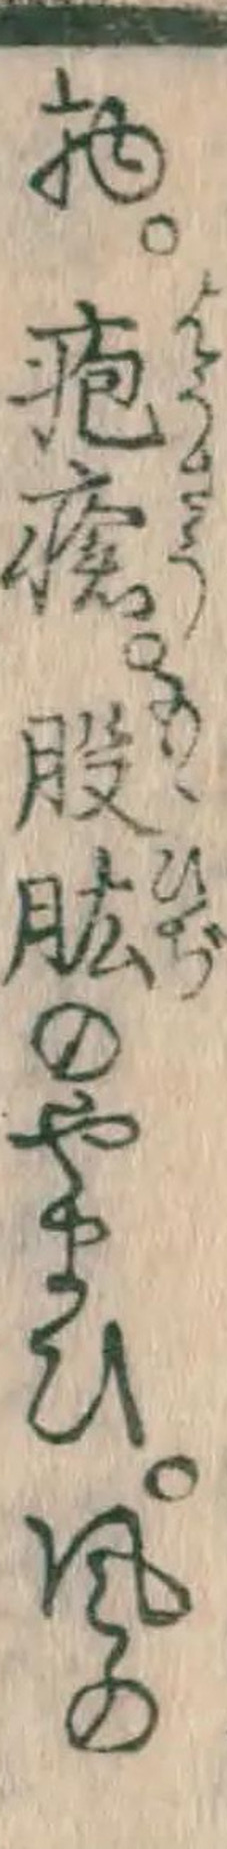物。疱瘡。股肱のやまひ。風の
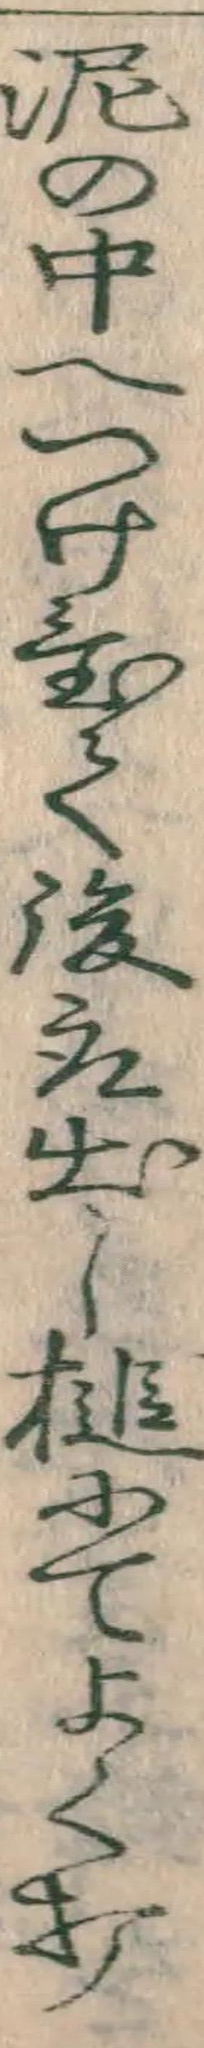泥の中へつけ置て後取出し槌にてよく打
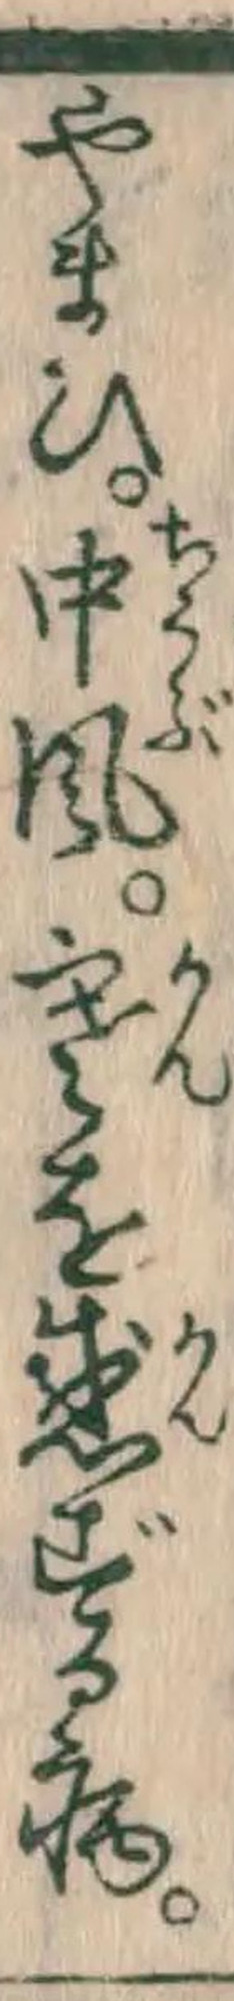やまひ。中風。寒を感ずる病。
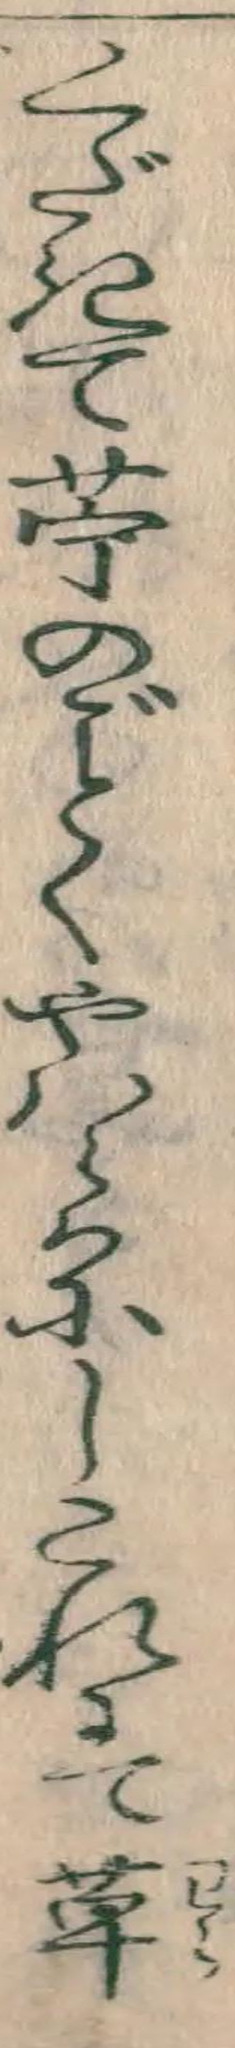くだきて苧のごとくやはらかにしこれにて草
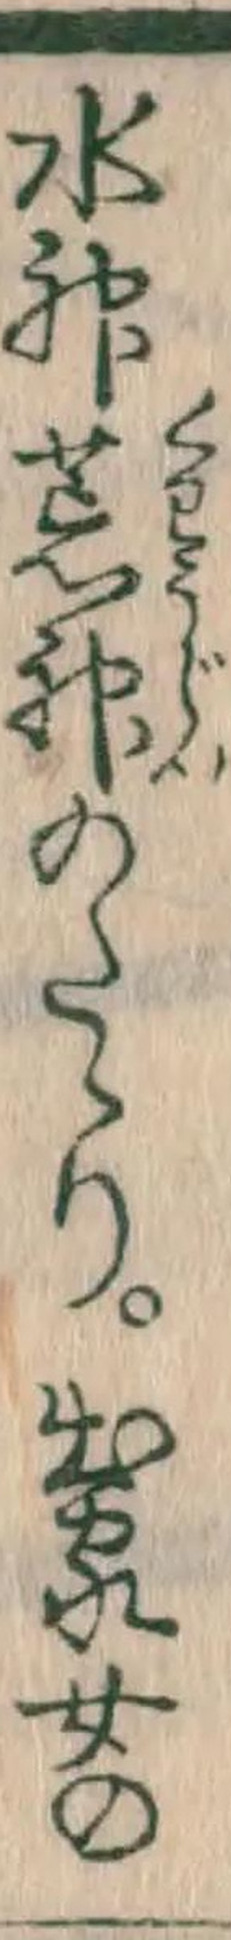水神荒神のたゝり。出家女の
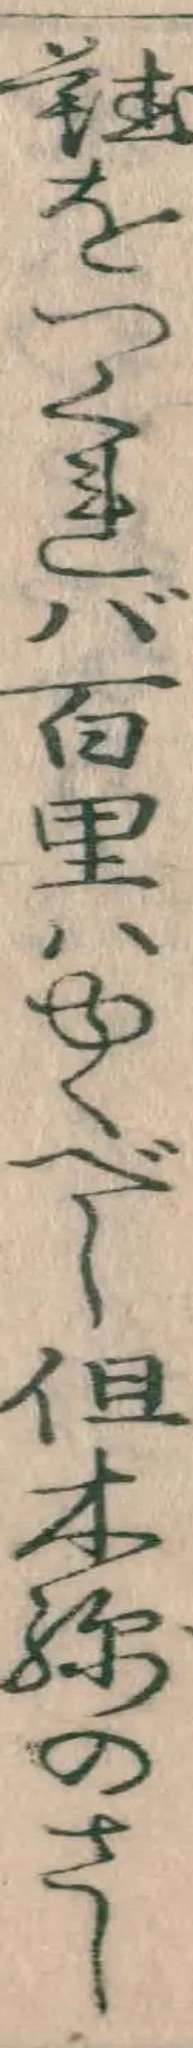鞋をつくれば百里はゆくべし但木綿のさし
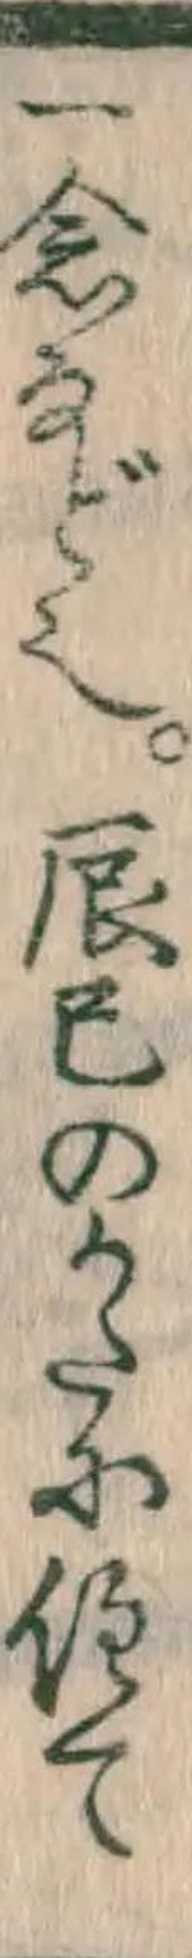一念など也。辰巳のかたに住て
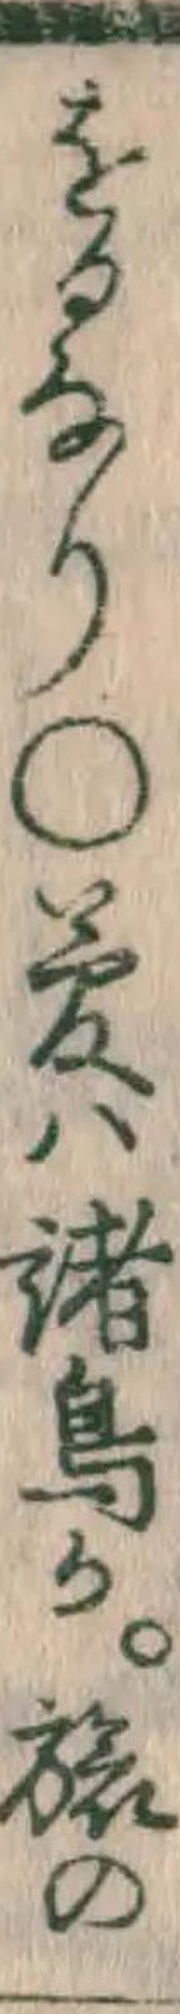をるなり○夢は諸鳥か。旅の
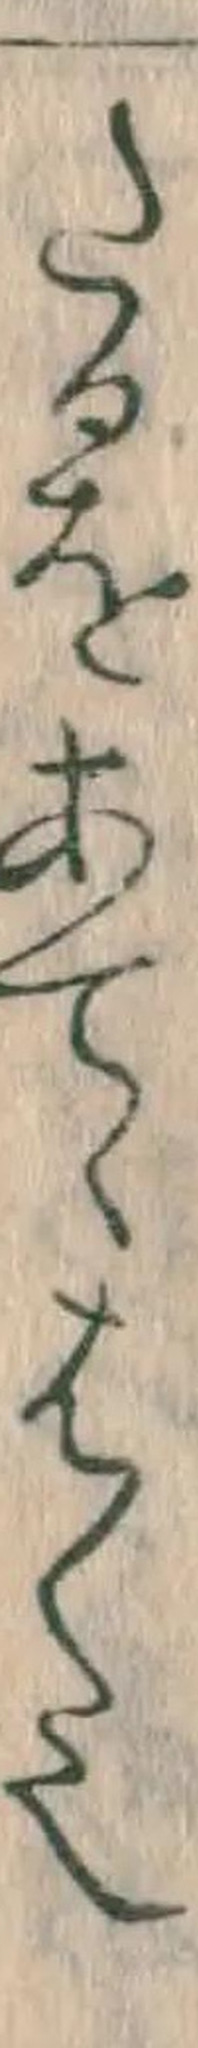たるをあてゝはく也
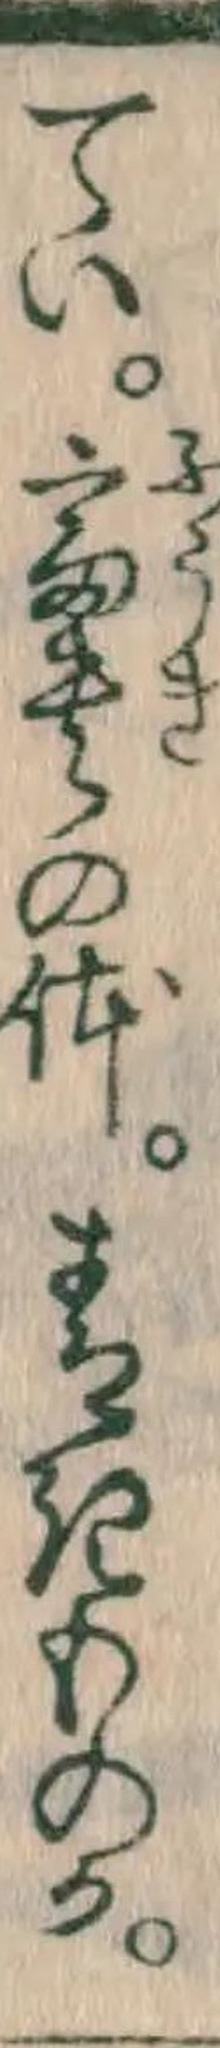てい。富貴の体。青きものか。
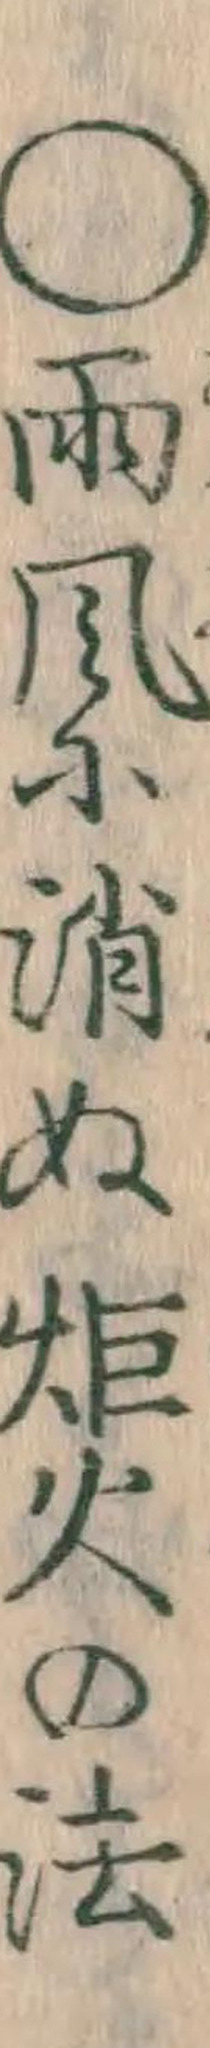○雨風に消ぬ炬火の法
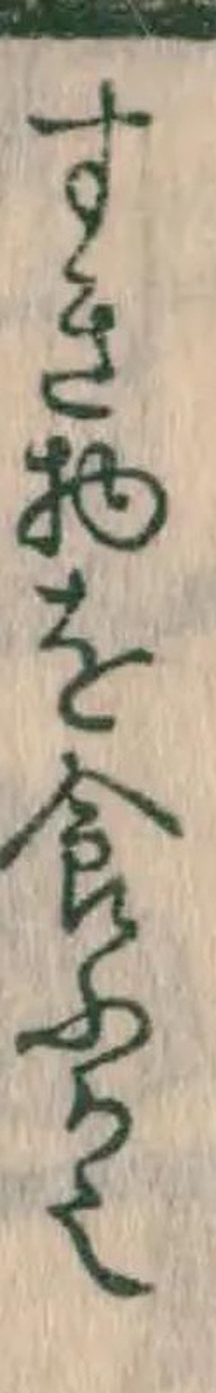すき物を食ふか也
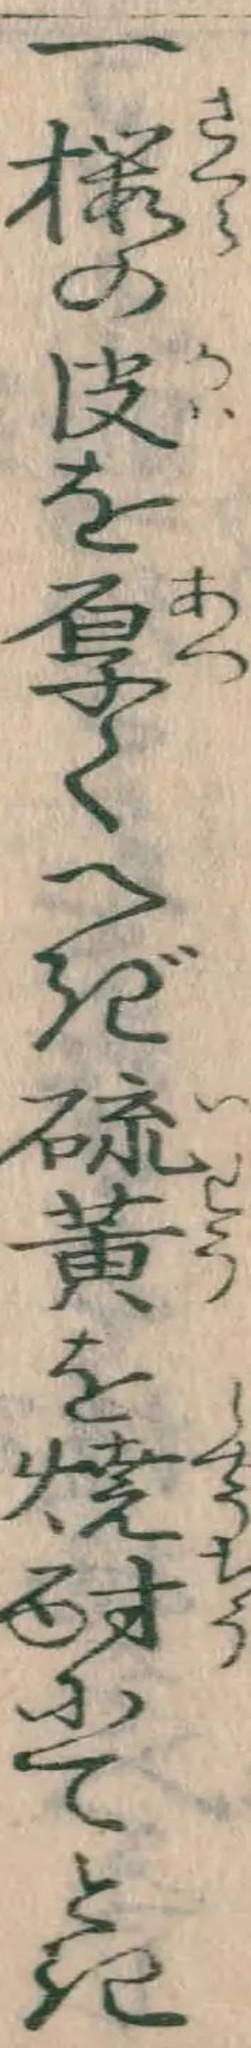一桜の皮を厚くへぎ硫黄を焼酎にてとき
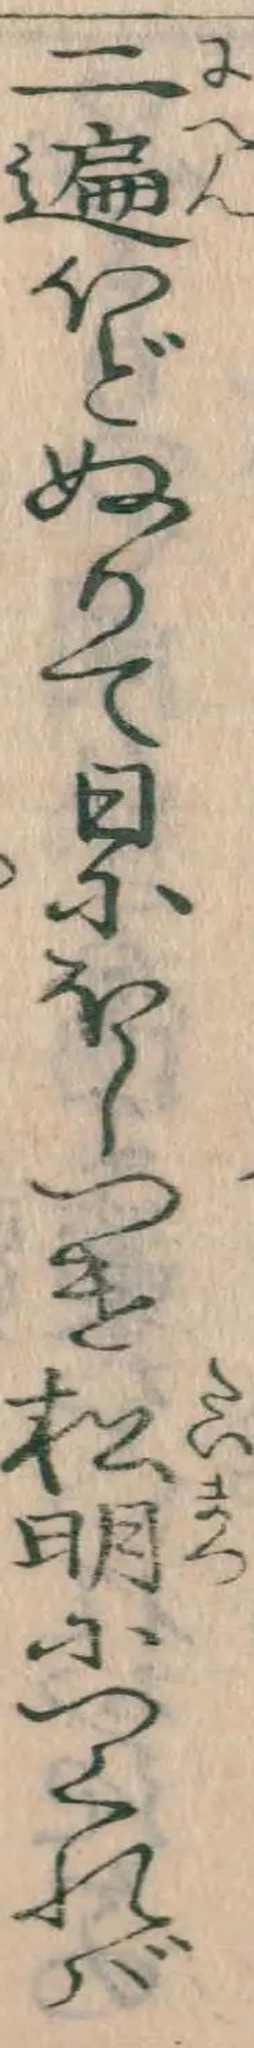二遍ほどぬりて日にほしつけ松明につくれば
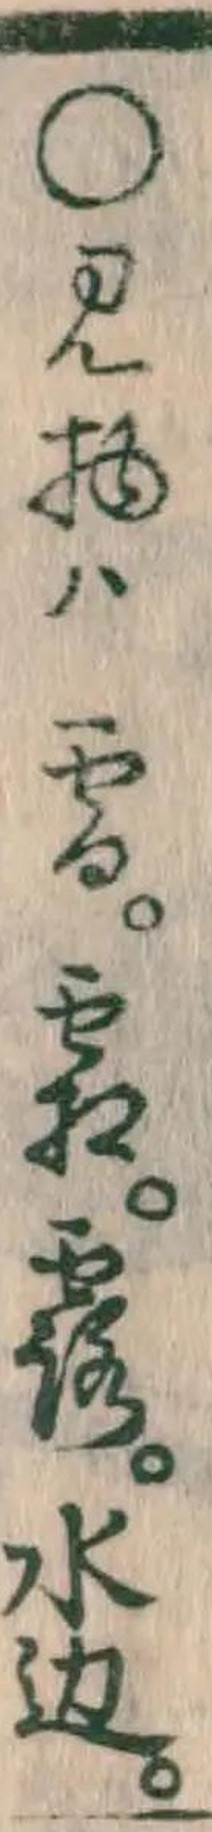○見物は雪。霜。露。水辺。
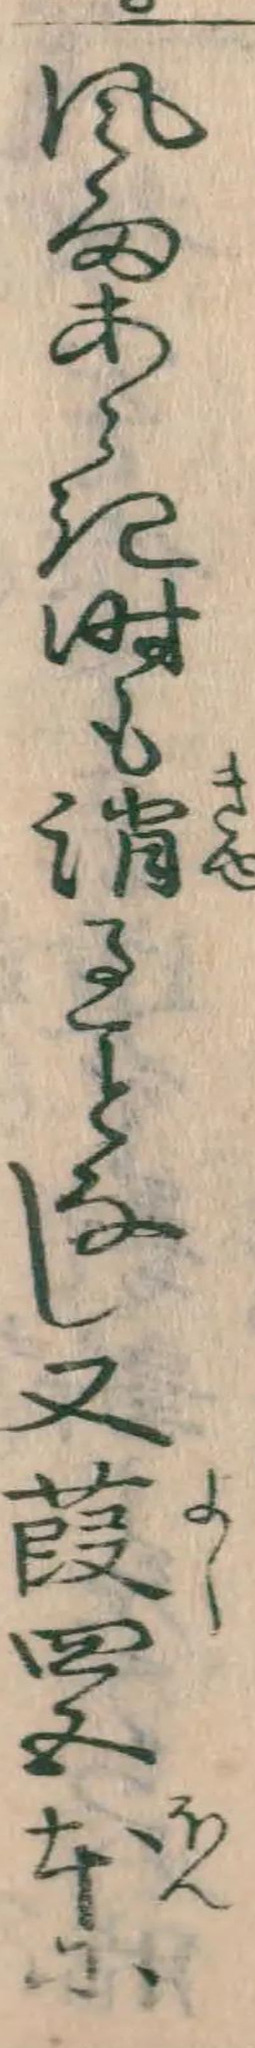風雨あらき時も消ることなし又葭四五本に
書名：広益秘事大全 3巻. [1]
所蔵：国立国会図書館 National Diet Library, JAPAN
